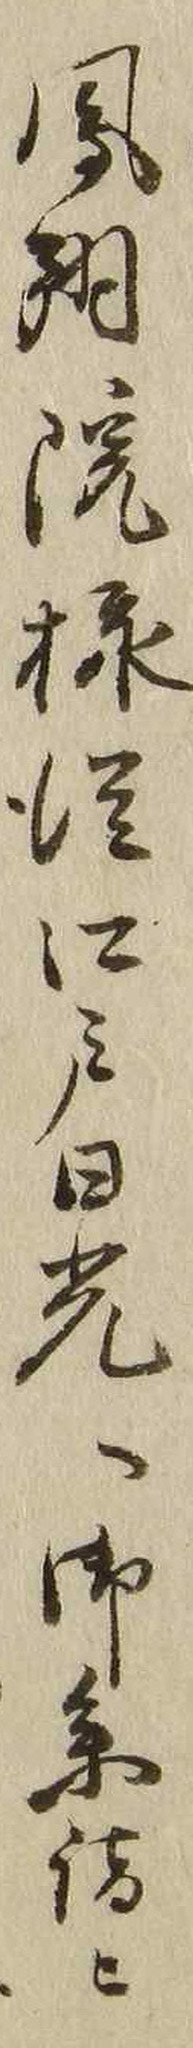鳳翔院様従江戸日光へ御参詣被
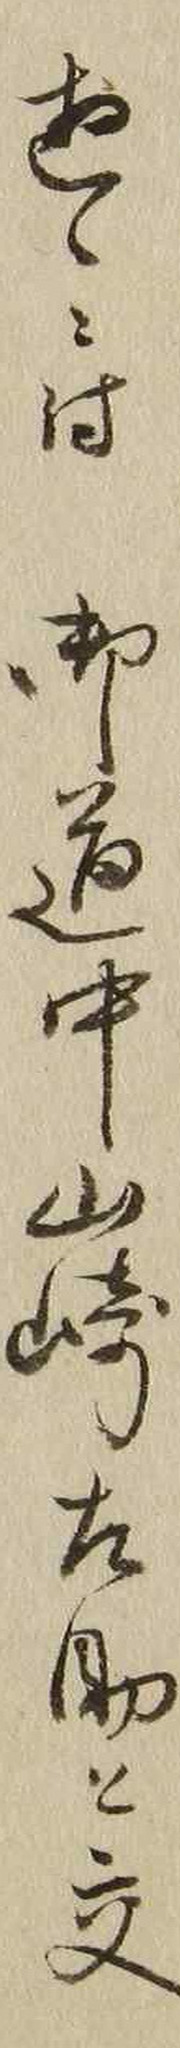遊候ニ付御道中山崎左助と交
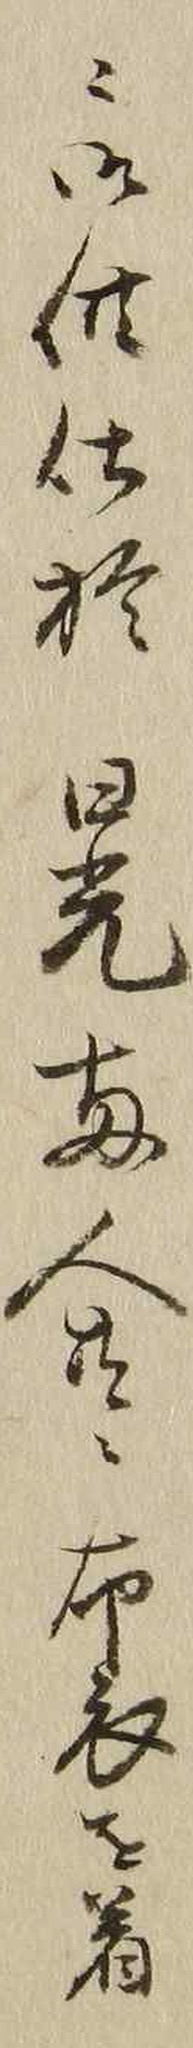ニ御供仕於日光両人共々布衣を着
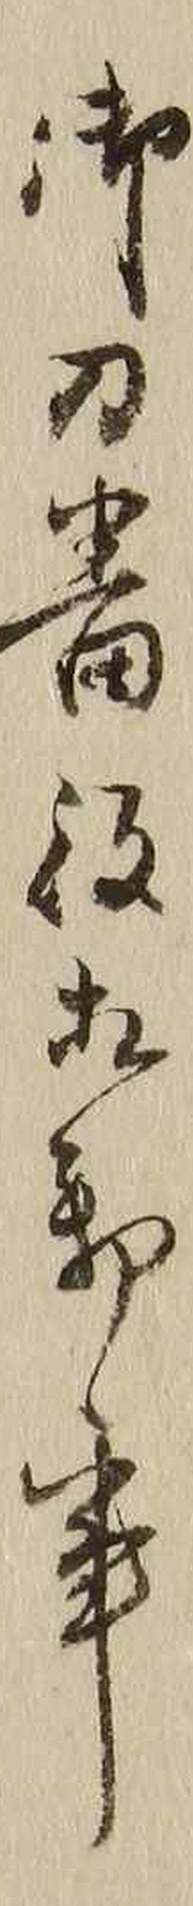御刀番役相候事
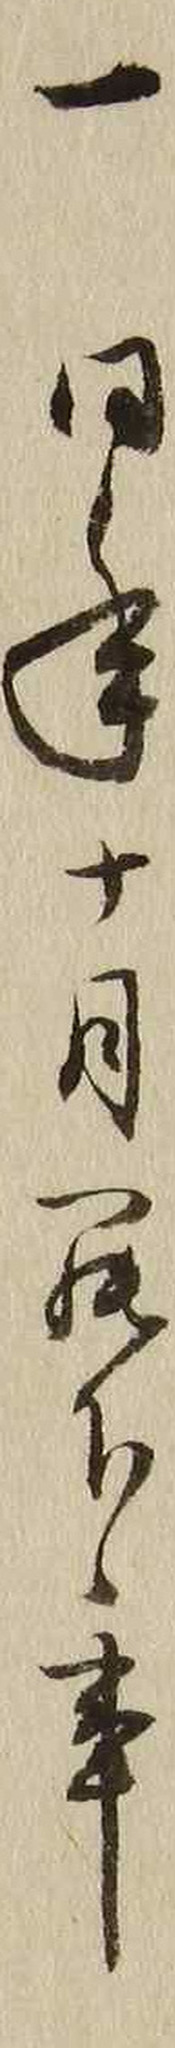一同年十月罷下候事
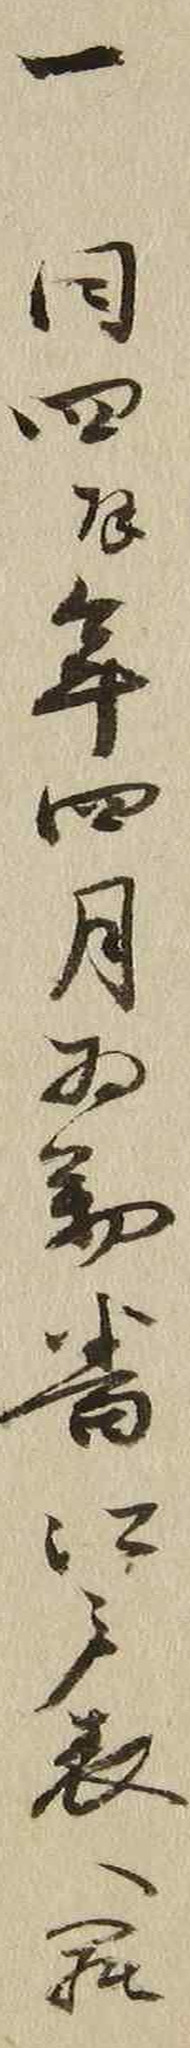一同四辰年四月為勤番江戸表へ罷
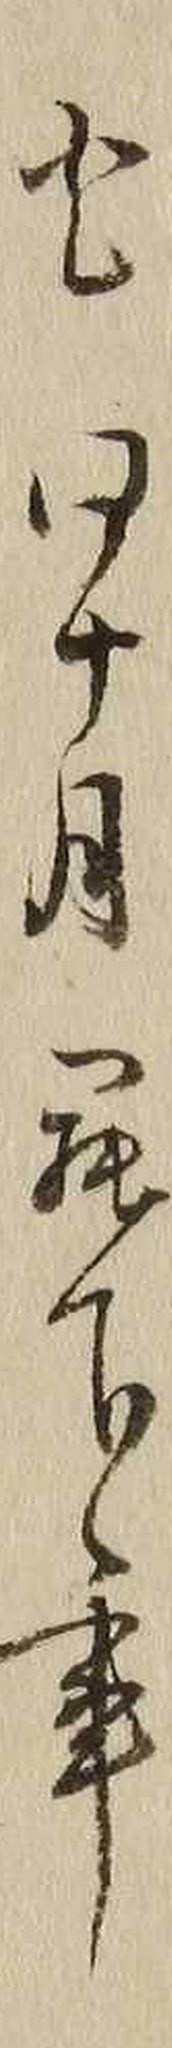登同十月罷下候事
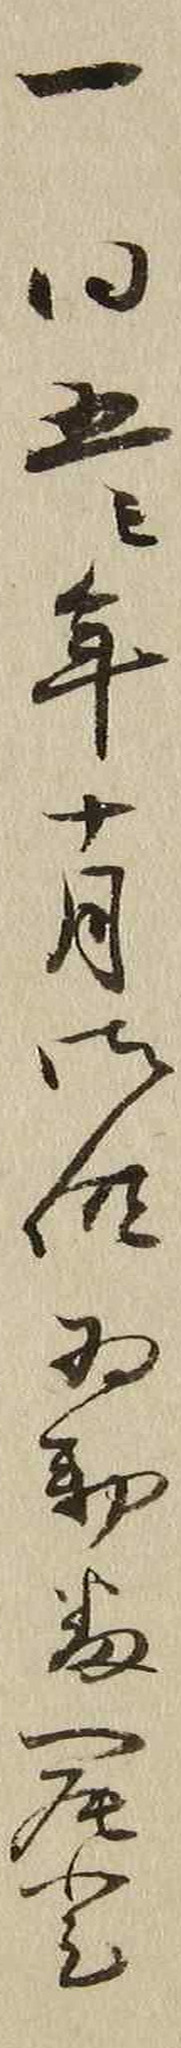一同五巳年十月御供為勤番罷登
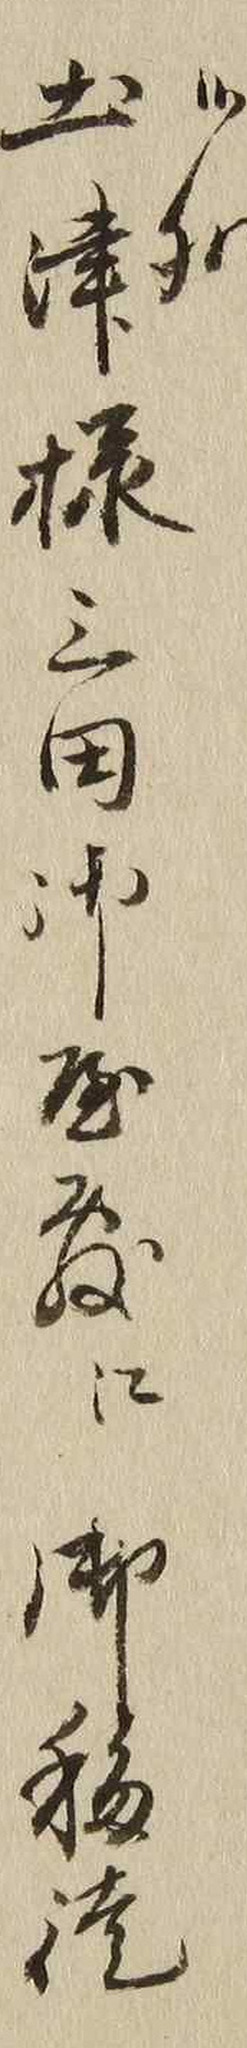土津様三田御屋敷江御移徒
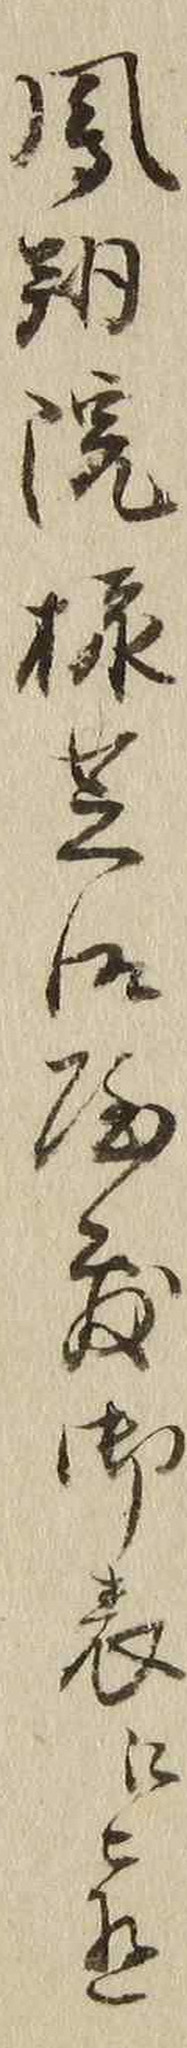鳳翔院様芝御屋敷御表江被遊
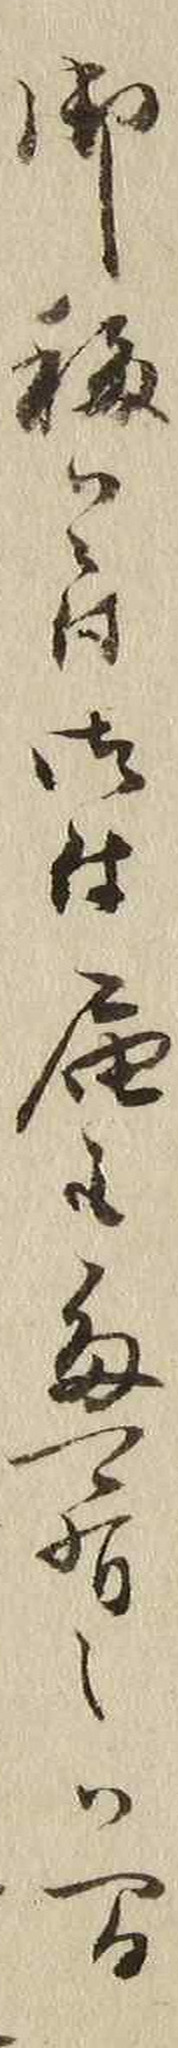御移候ニ付御付届も多可有之候間
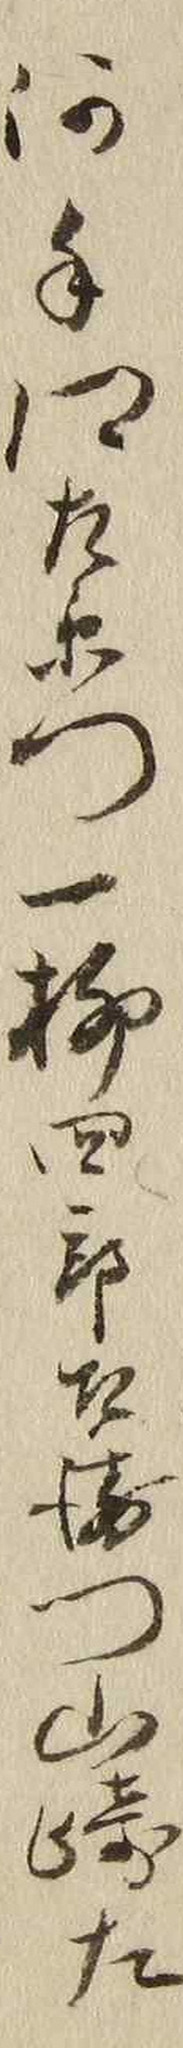河手郷左衛門一柳四郎左衛門山崎左
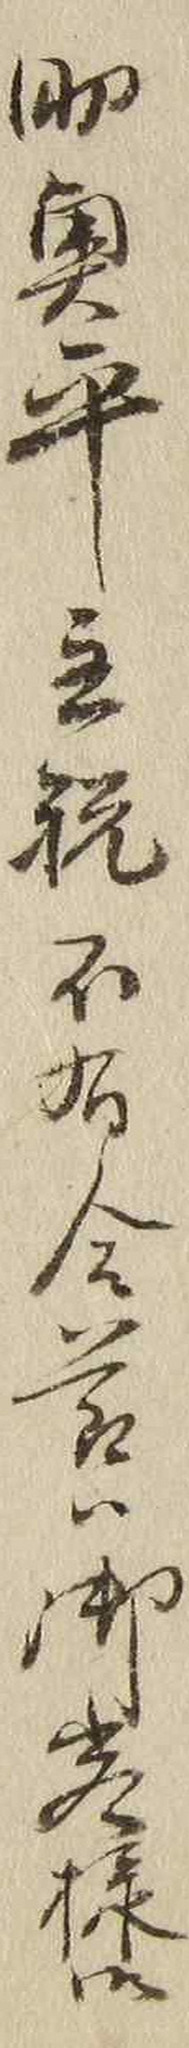助奥平主税不有合節ハ御客様御
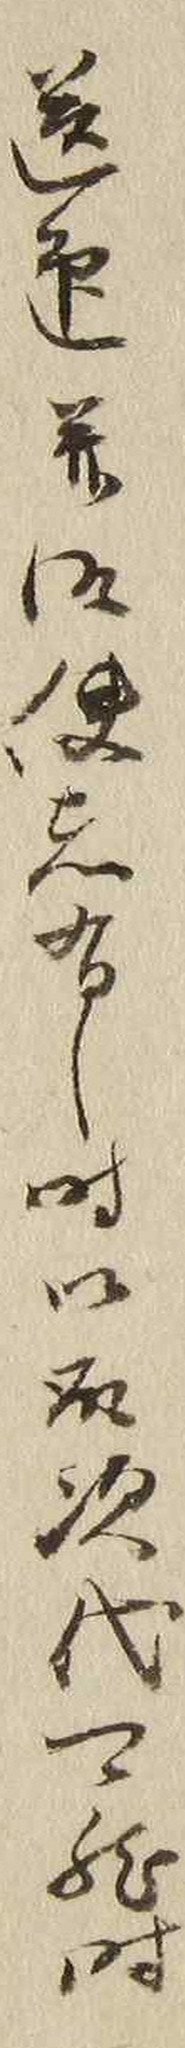送迎并御使者有之時御取次代可然時
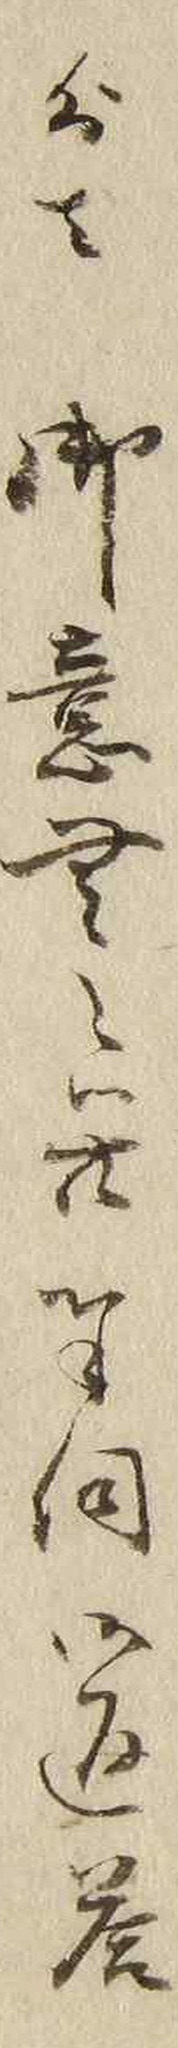分を御意無之候共奉伺御返答
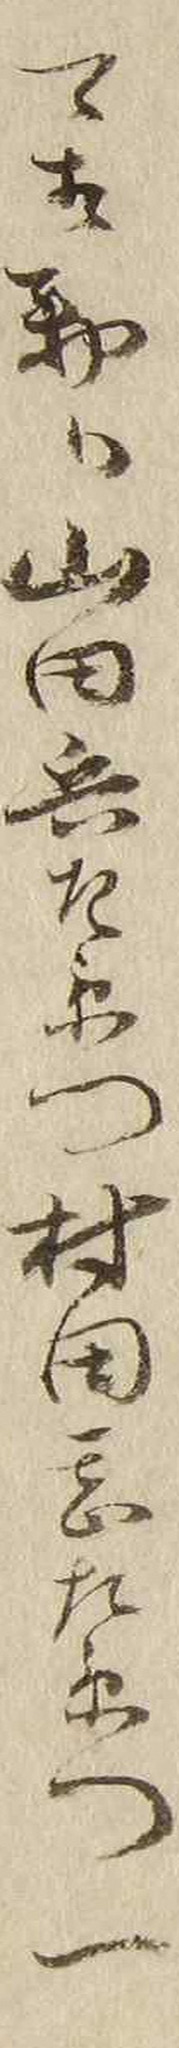可相勤候山田兵左衛門村田甚左衛門一
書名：諸士系譜　巻之225　ま之部6
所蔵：会津若松市立会津図書館
